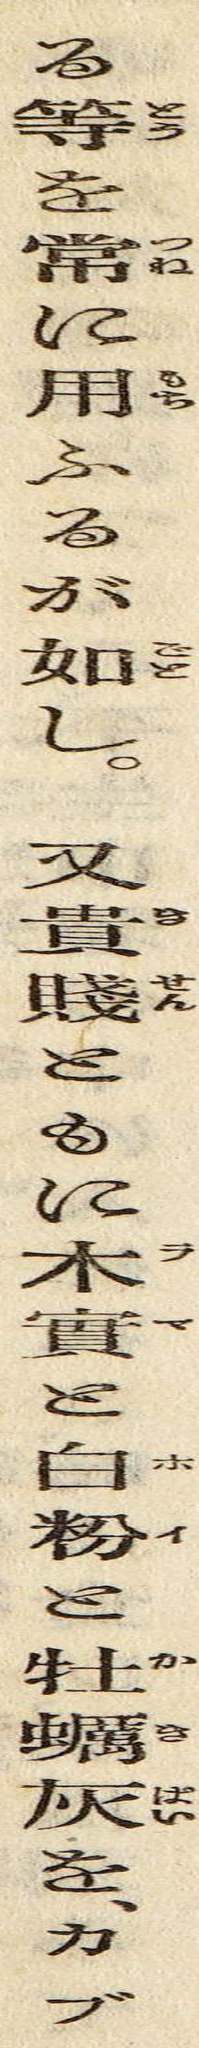る等を常に用ふるが如し。又貴賤ともに木実と白粉と牡蠣灰を、カブ

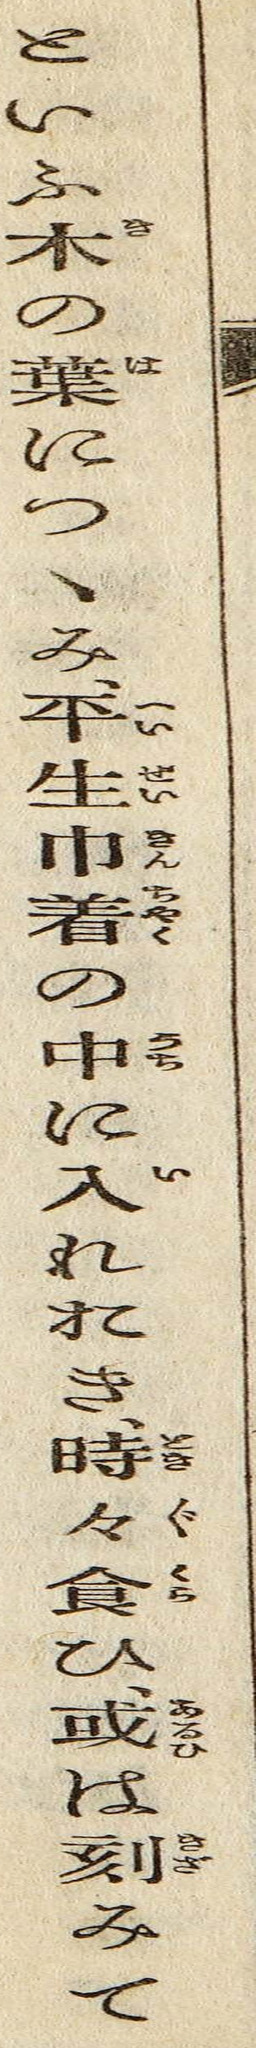といふ木の葉につヽみ、平生巾着の中に入れおき、時々食ひ、或は刻みて
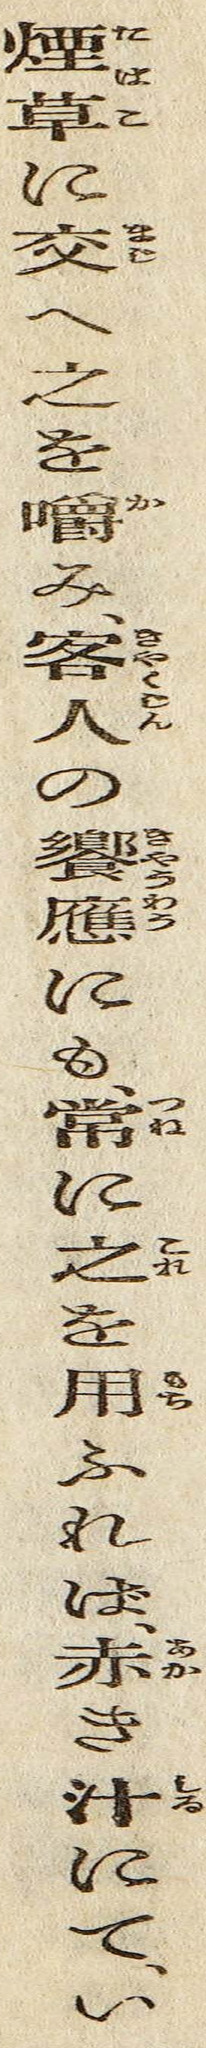煙草に交へ之を嚼み、客人の饗応にも、常に之を用ふれば、赤き汁にて、い
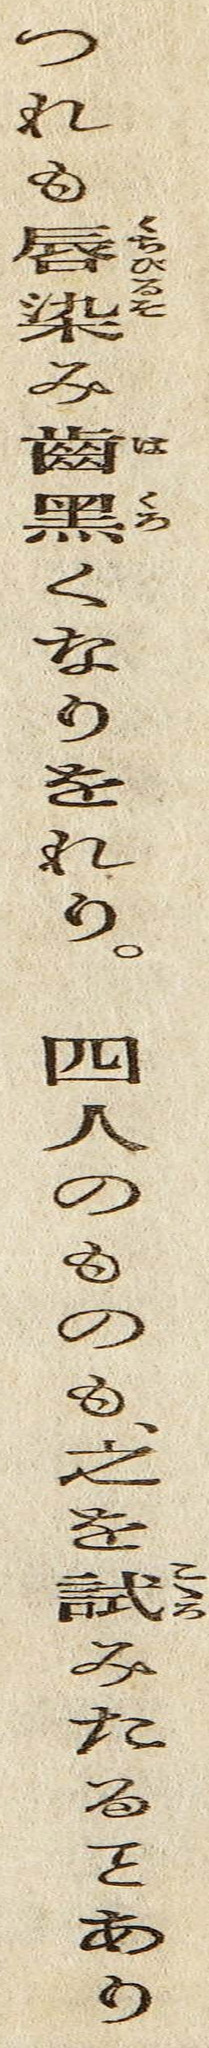つれも唇染み歯黒くなりをれり。四人のものも、之を試みたることあり
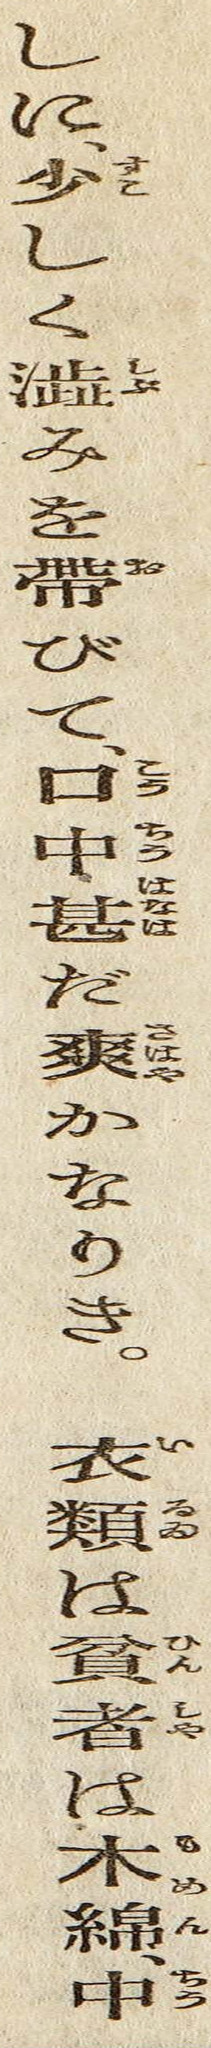しに、少しく渋みを帯びて、口中甚だ爽かなりき。衣類は貧者は木綿、中
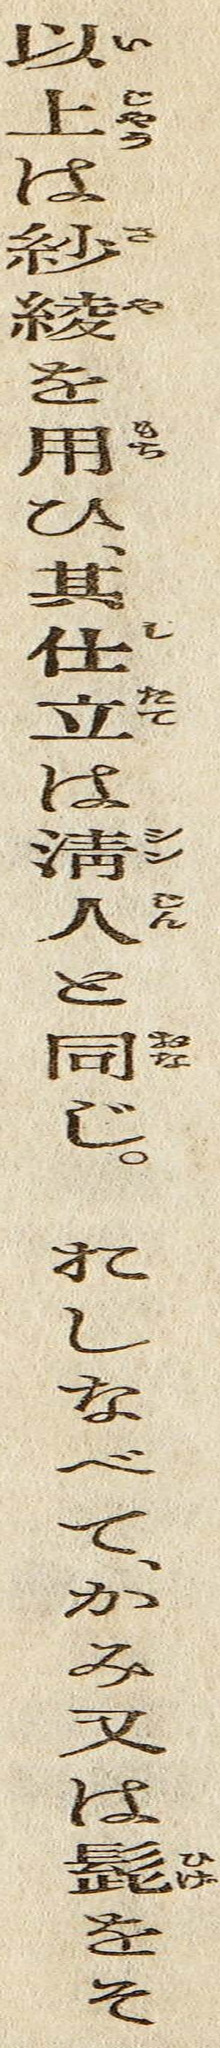以上は紗綾を用ひ、其仕立は清人と同じ。おしなべて、かみ又は髭をそ
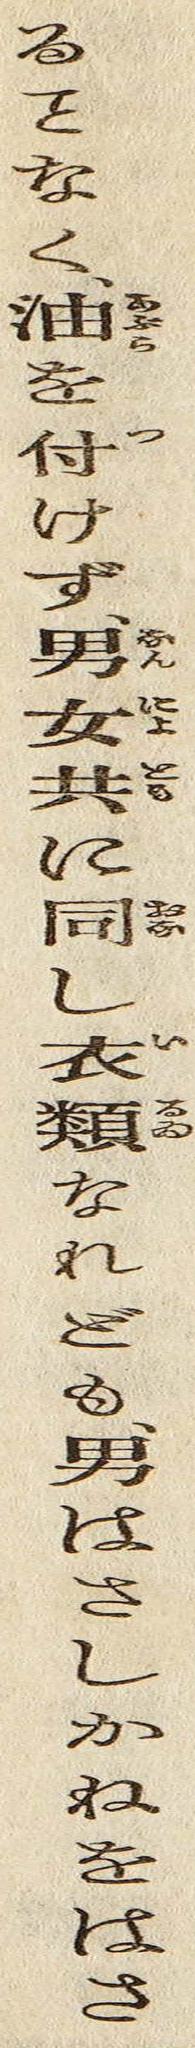ることなく、油を付けず、男女共に同し衣類なれども、男はさしかねをはさ
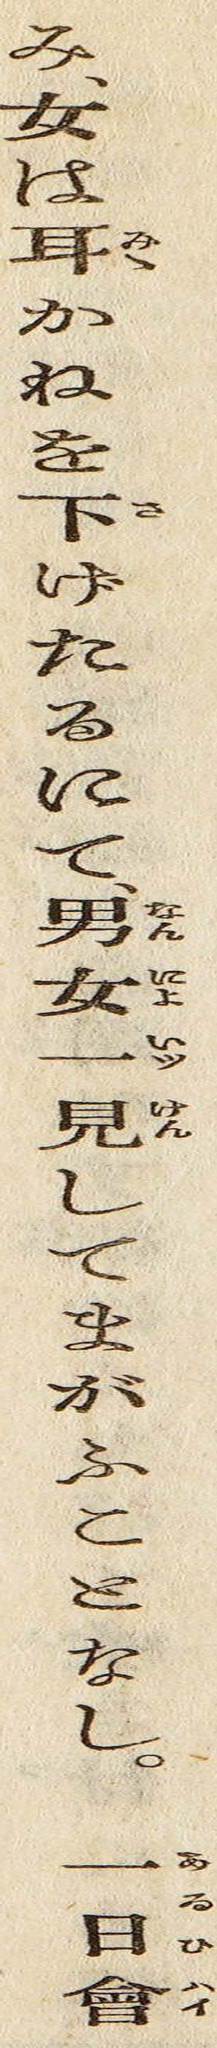み、女は耳かねを下げたるにて、男女一見してまがふことなし。一日会
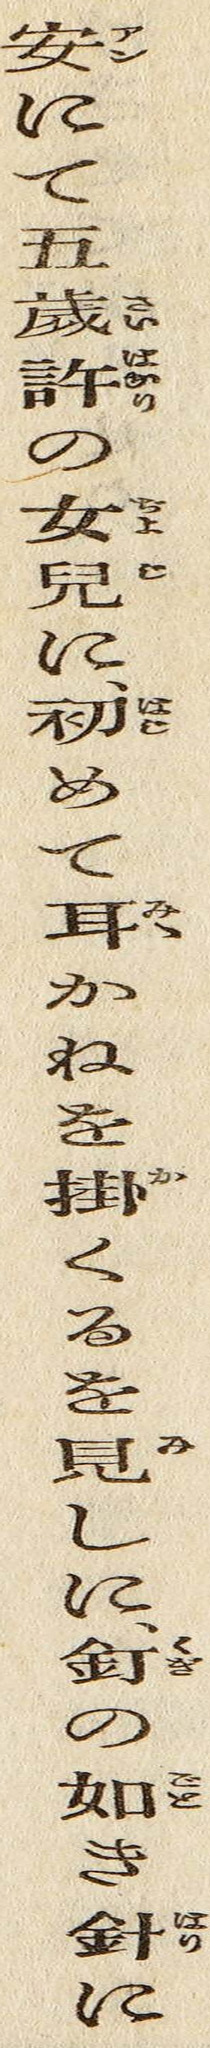安にて五歳許の女児に、初めて耳かねを掛くるを見しに、釘の如き針に
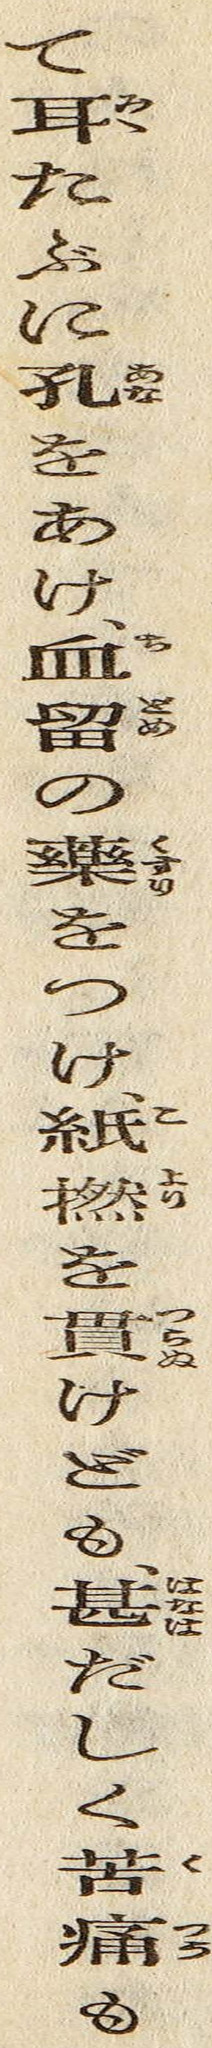て耳たぶに孔をあけ、血留の薬をつけ、紙撚を貫けども、甚だしく苦痛も
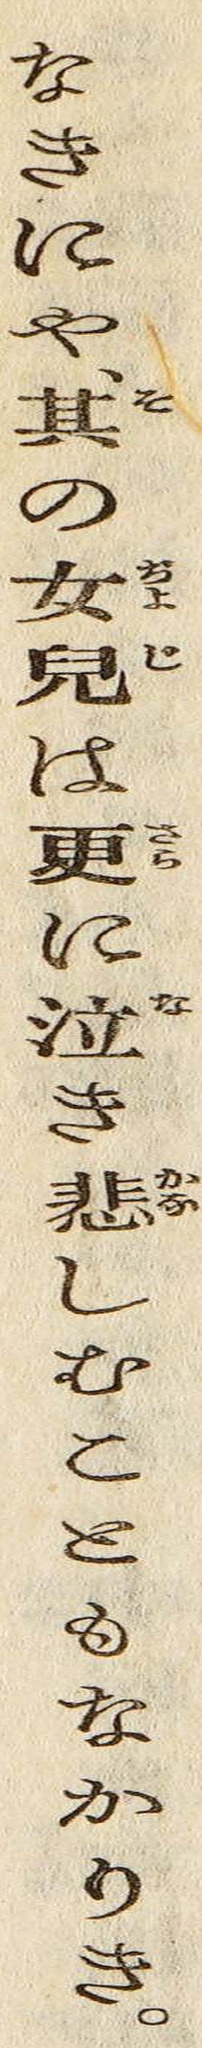なきにや、其の女児は更に泣き悲しむこともなかりき。
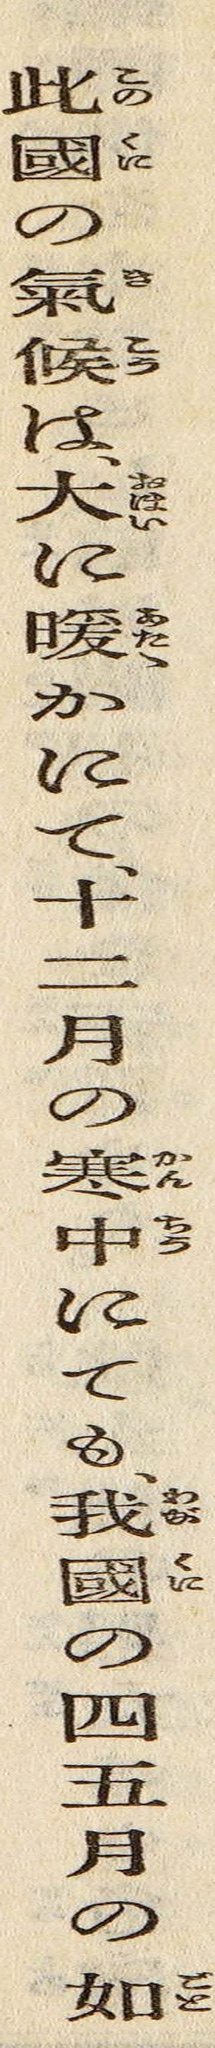此国の気候は、大に暖かにて、十二月の寒中にても、我国の四五月の如
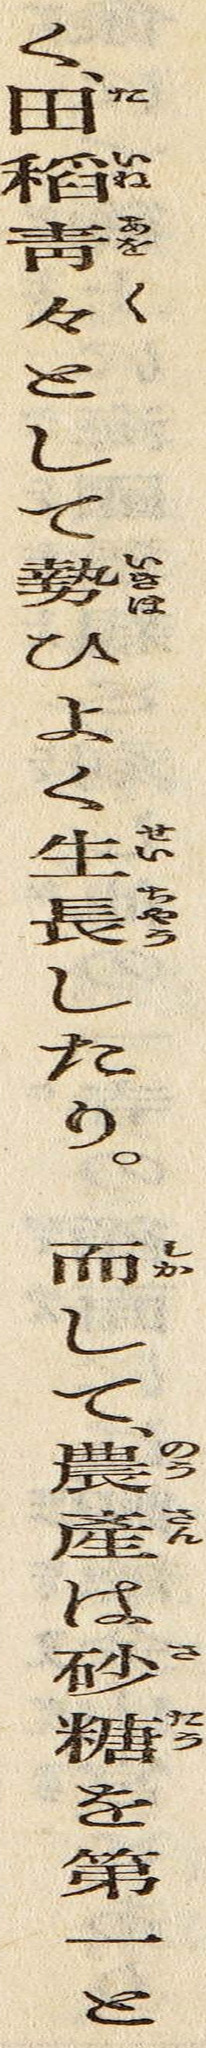く、田稲青々として勢ひよく生長したり。而して、農産は砂糖を第一と
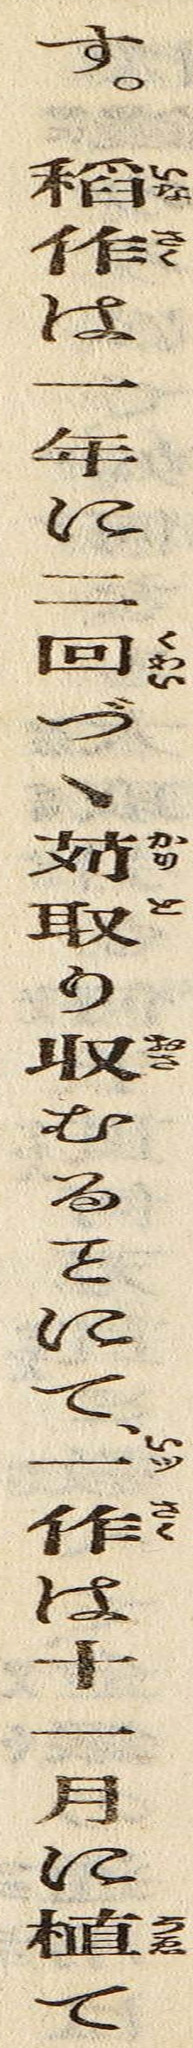す。稲作は一年に二回づヽ苅取り収むることにて、一作は十一月に植て
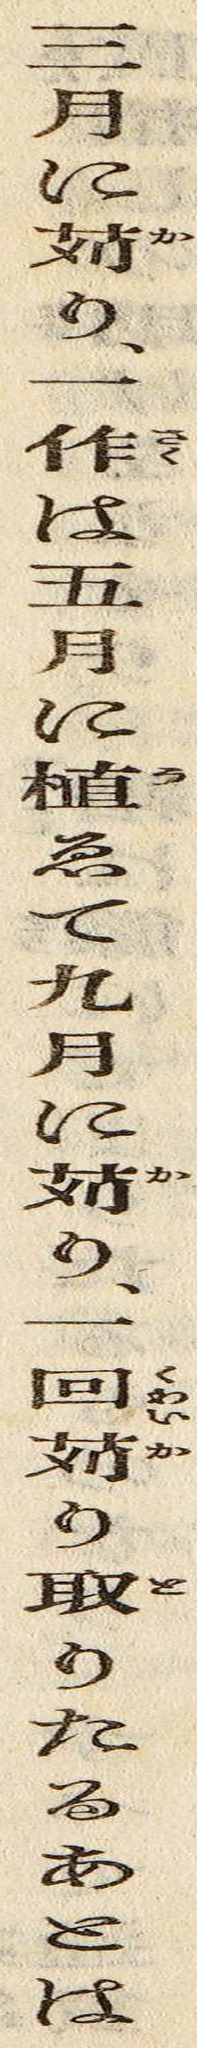三月に苅り、一作は五月に植ゑて九月に苅り、一回苅り取りたるあとは
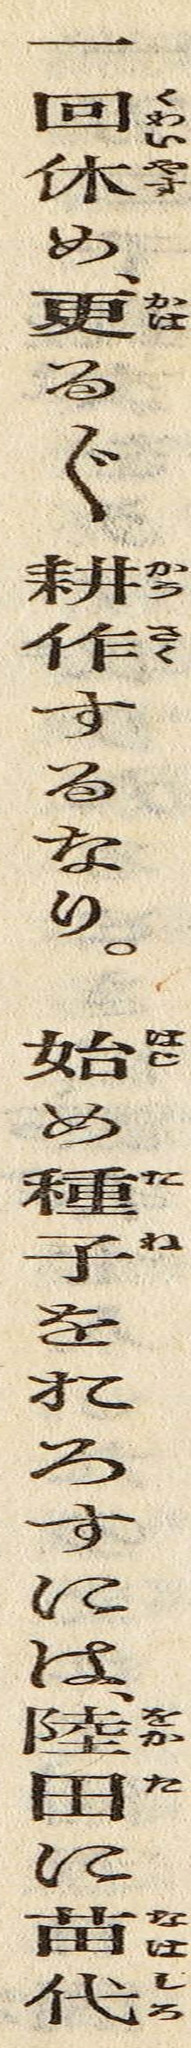一回休め、更る〴〵耕作するなり。始め種子をおろすには、陸田に苗代
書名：日本漂流譚
